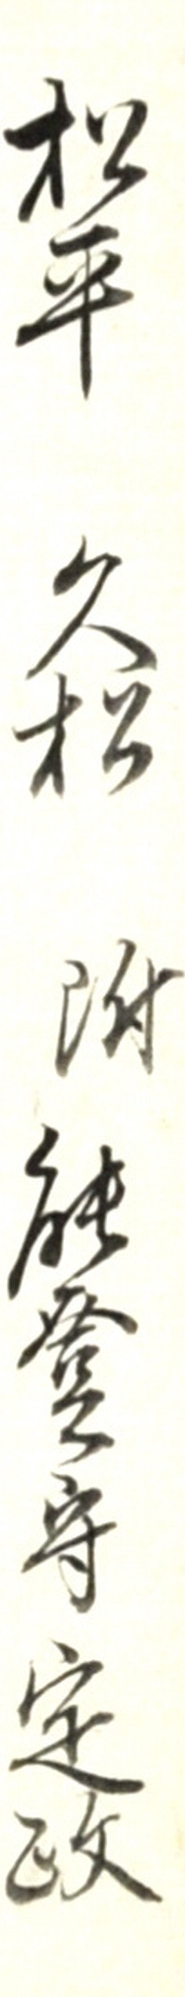松平久松付能登守定政
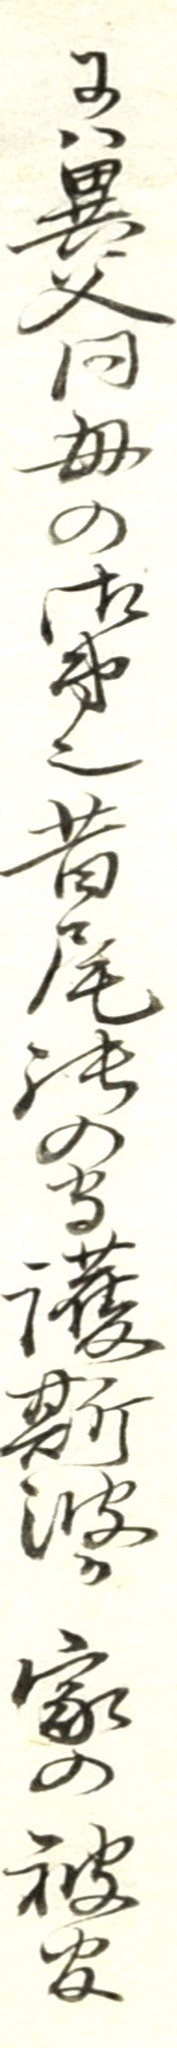には異父同母の御弟也昔尾張の守護斯波か家の被官
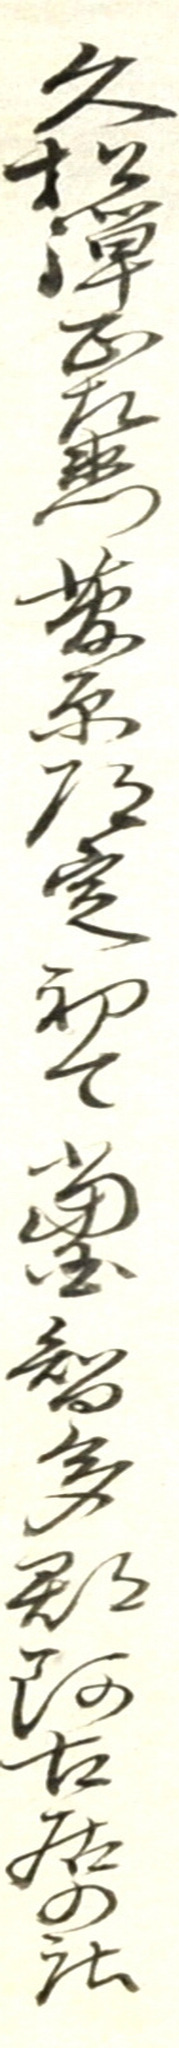久松弾正左衛門菅原道定初て当国智多郡阿古居の庄
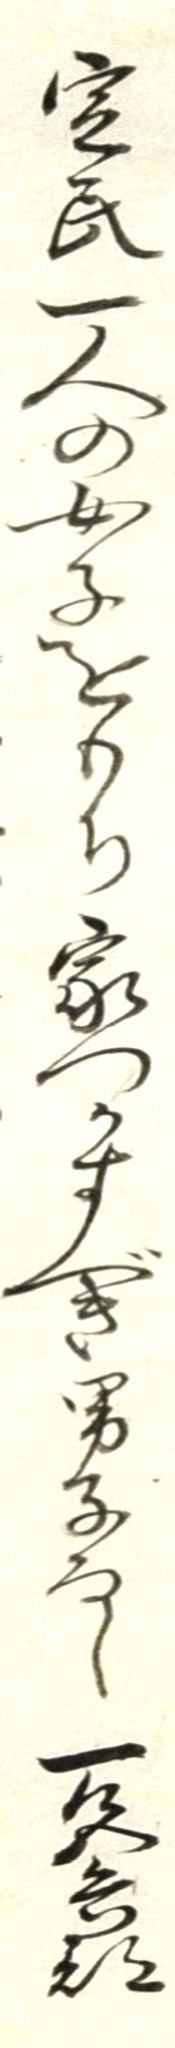定民一人の女子をもち家つかすべき男子なし一色兵部
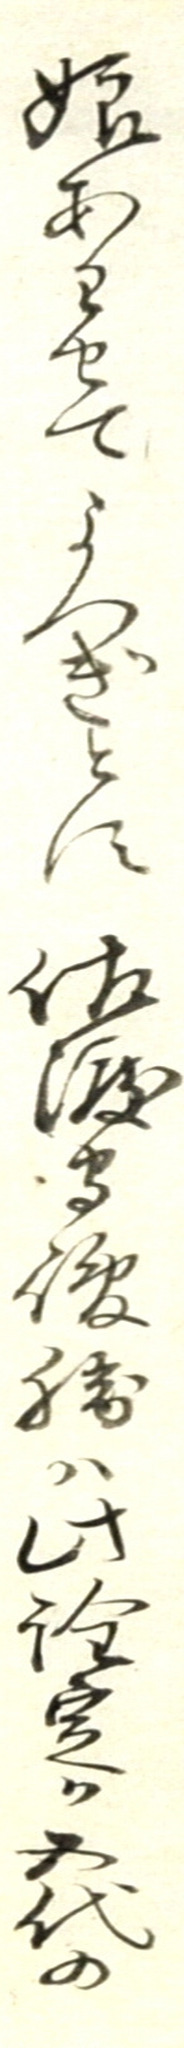娘あわせてよつぎとす佐渡守俊勝は此詮定か五代の
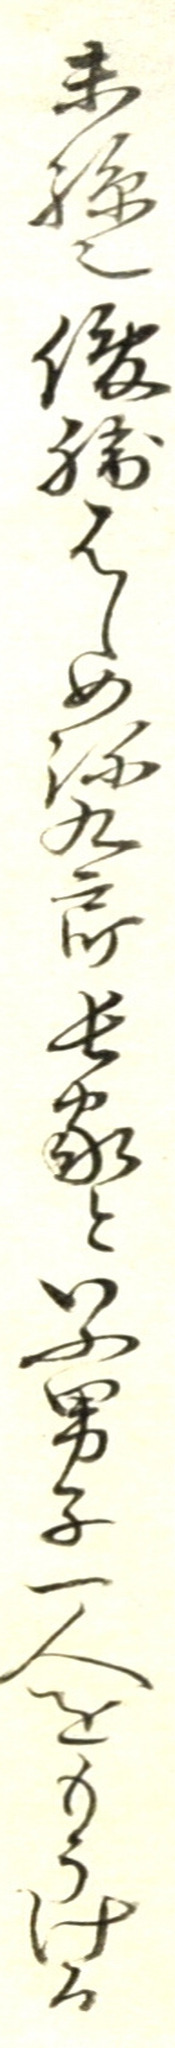末孫也俊勝はしめ弥九郎長家といふ男子一人をもうける

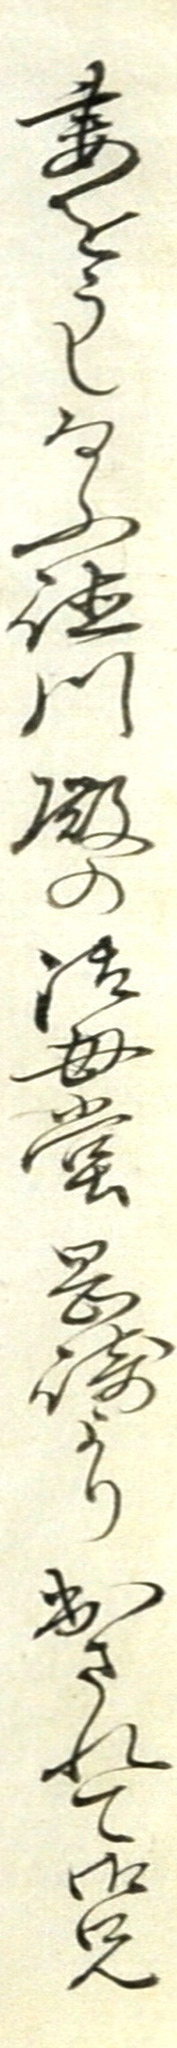妻をうしなふ徳川殿の御母堂岡崎より出されて御兄
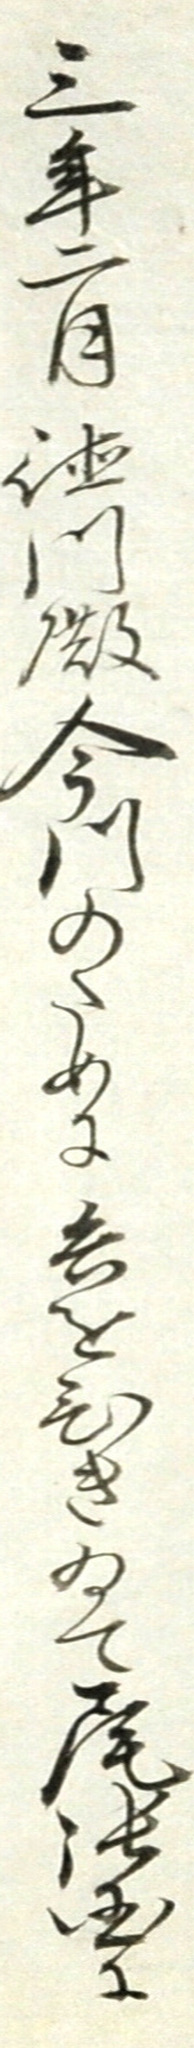三年二月徳川殿今川のために兵をひきゐて尾張国に
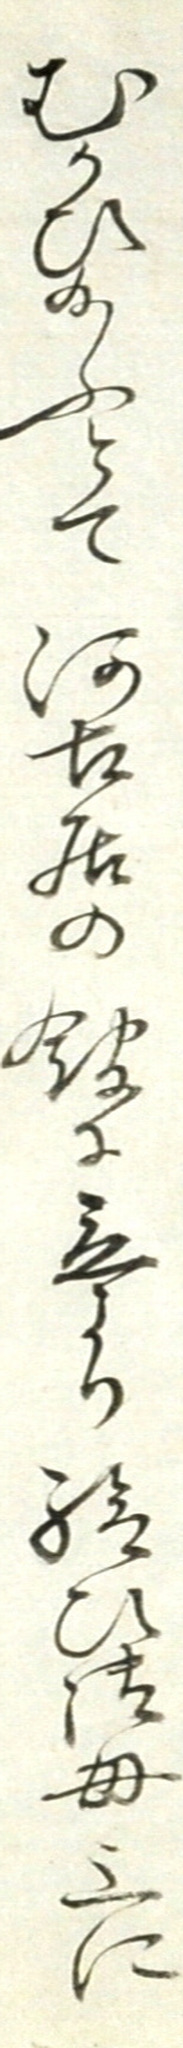むかひ給ふとて阿古居の館に立より給ひ御母上に
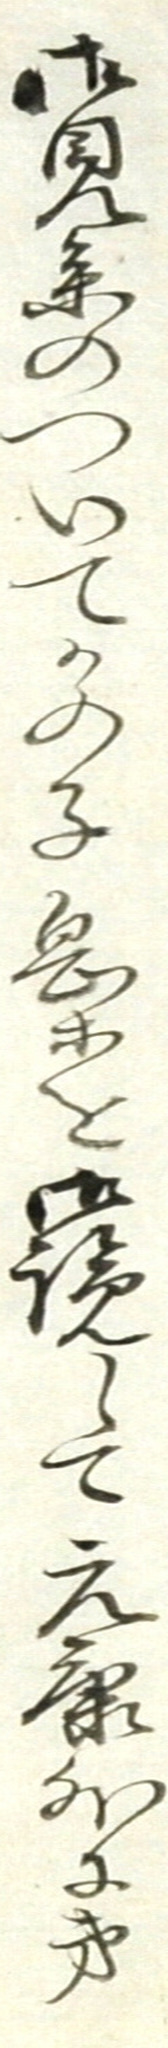御見参のついてかの子息等を御覧して元康外に弟
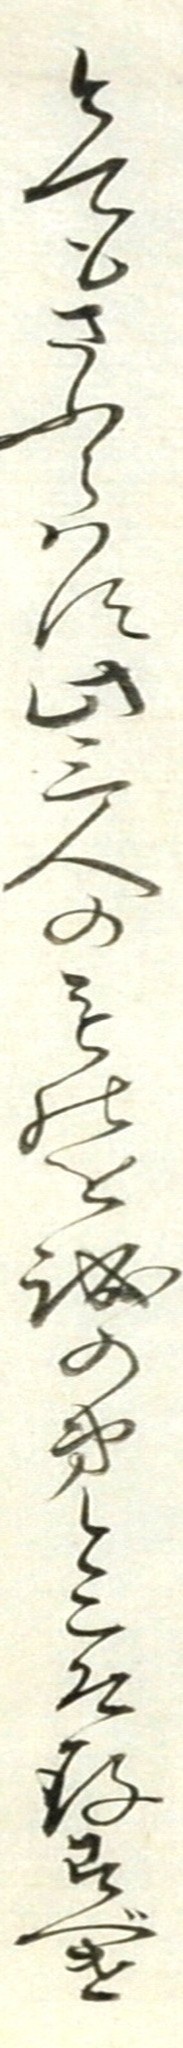とてもさふらはす此三人のものを誠の弟とこそ存すべけ
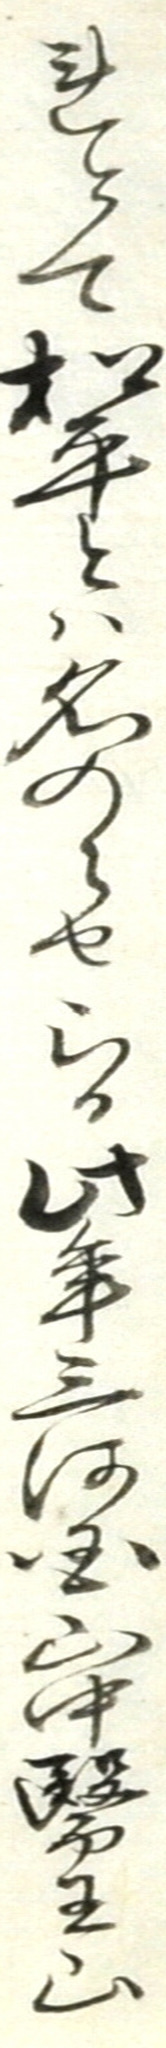れとて松平とは名のらせらる此年三河国山中医王山
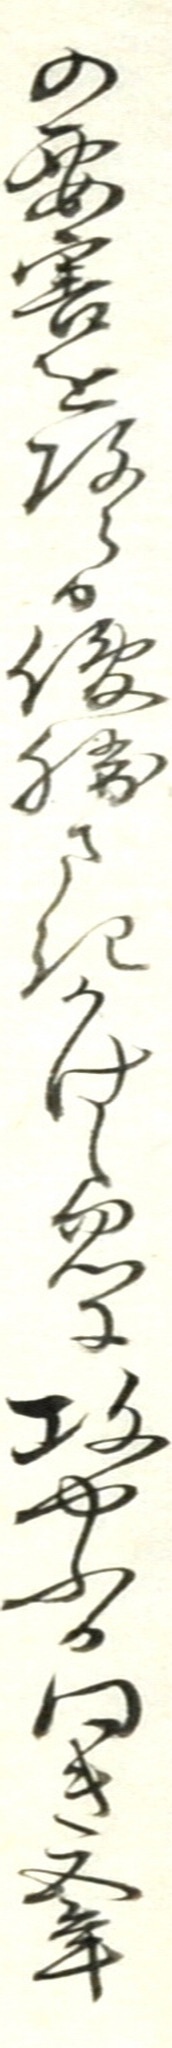の要害を攻しか俊勝さきかけし忽に攻やふる同き五年
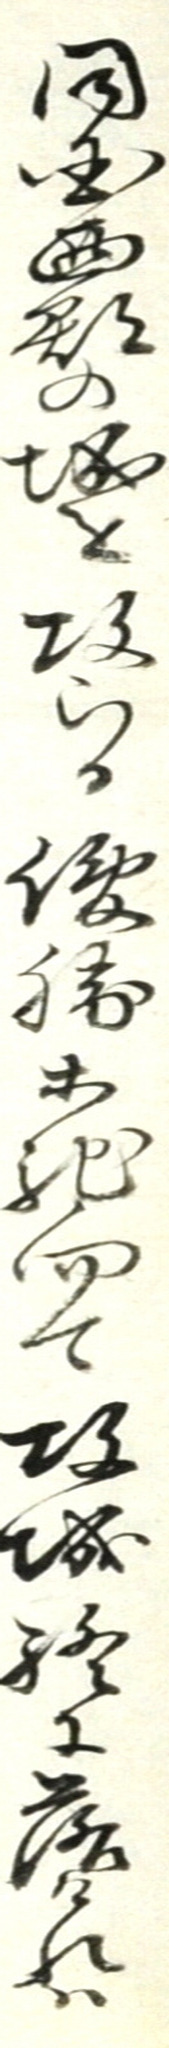同国西郡の城攻らる俊勝等馳向て攻城終に落けれは
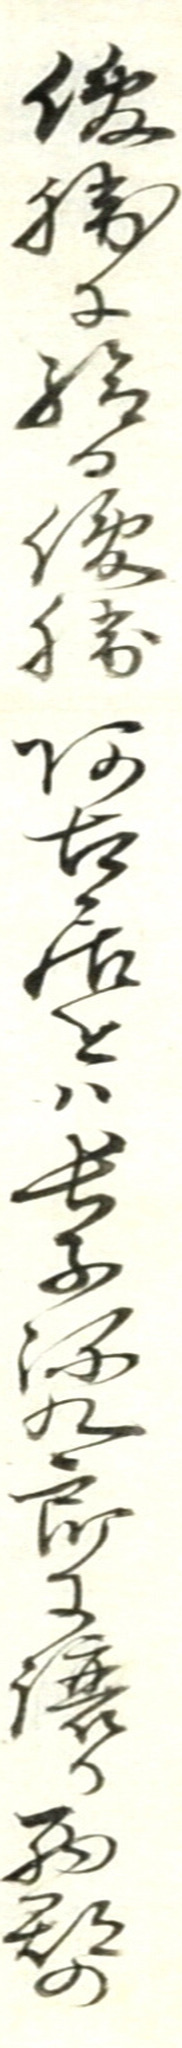俊勝に給る俊勝阿古居をは長子弥九郎に譲り西郡の
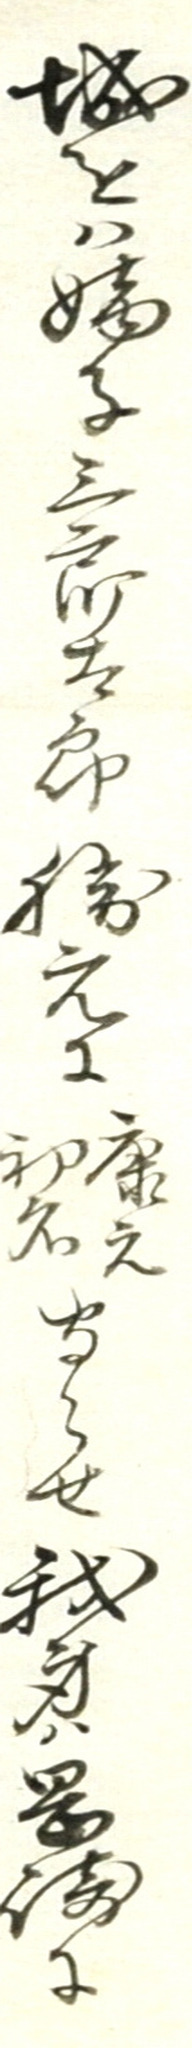城をは嫡子三郎太郎勝元に康元初名守らせ我身は岡崎に
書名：藩翰譜（二・三）
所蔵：伊那市立高遠町図書館・合同会社AMANE
